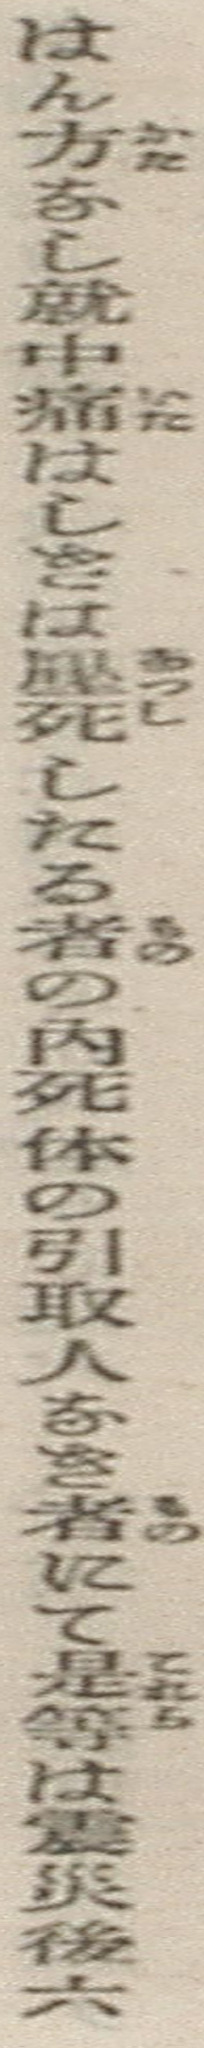はん方なし就中痛はしきは圧死したる者の内死体の引取人なき者にて是等は震災後六
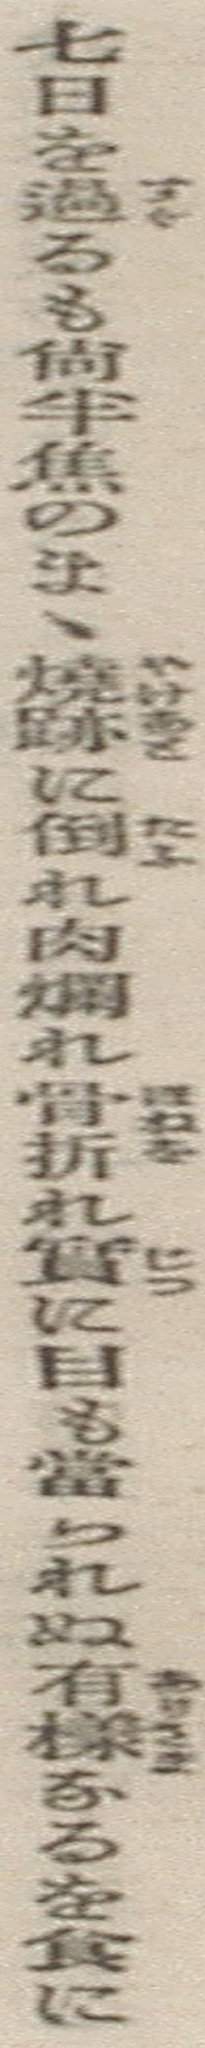七日を過るも尚半焦のまゝ焼跡に倒れ肉爛れ骨折れ実に目も当られぬ有様なるを食に
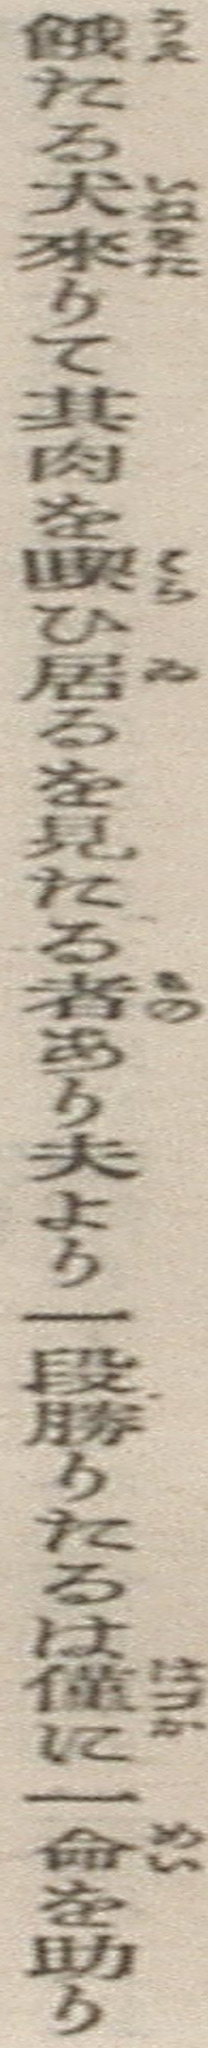餓たる犬来りて其肉を喫ひ居るを見たる者あり夫より一段勝りたるは僅に一命を助り
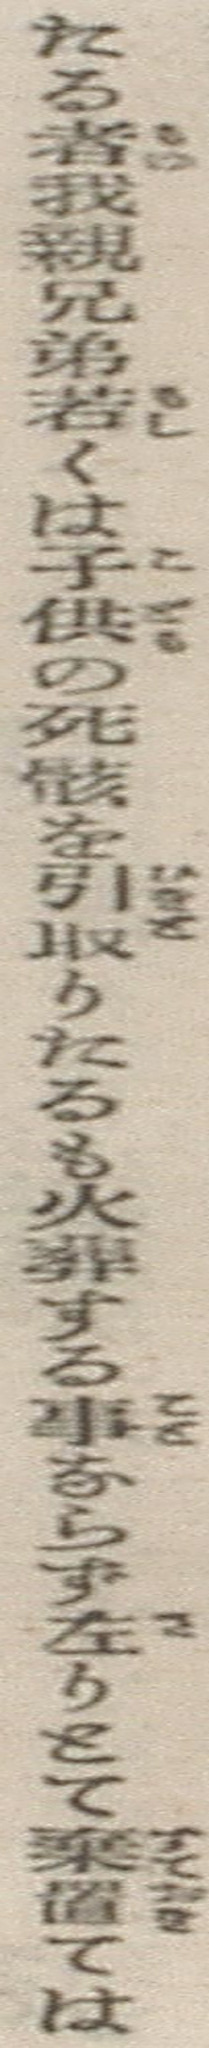たる者我親兄弟若くは子供の死骸を引取りたるも火葬する事ならず左りとて棄置ては
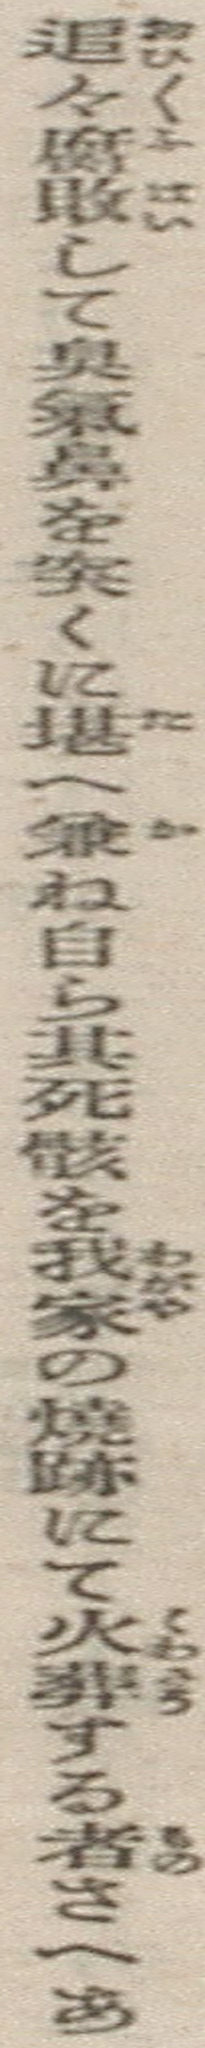追々腐敗して臭気鼻を突くに堪へ兼ね自ら其死骸を我家の焼跡にて火葬する者さへあ
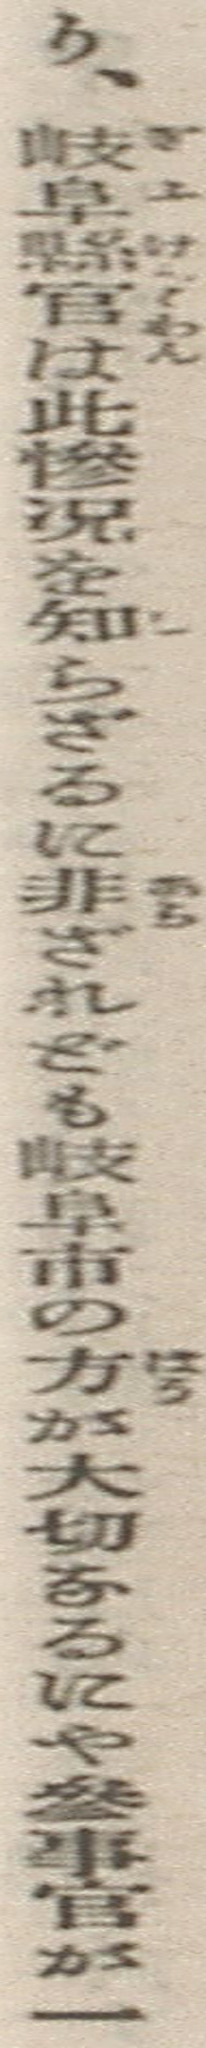り、岐阜県官は此惨况を知らざるに非ざれども岐阜市の方が大切なるにや参事官が一
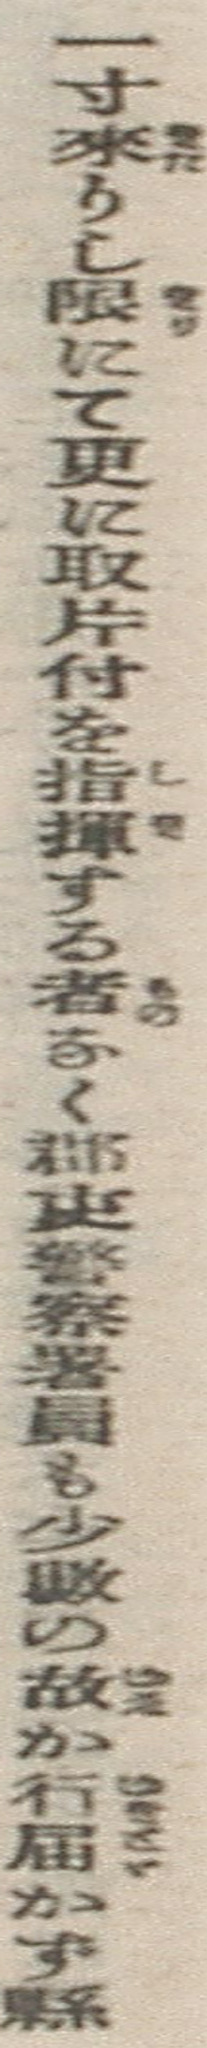一寸来りし限にて更に取片付を指揮する者なく郡吏警察署員も少数の故か行届かず県
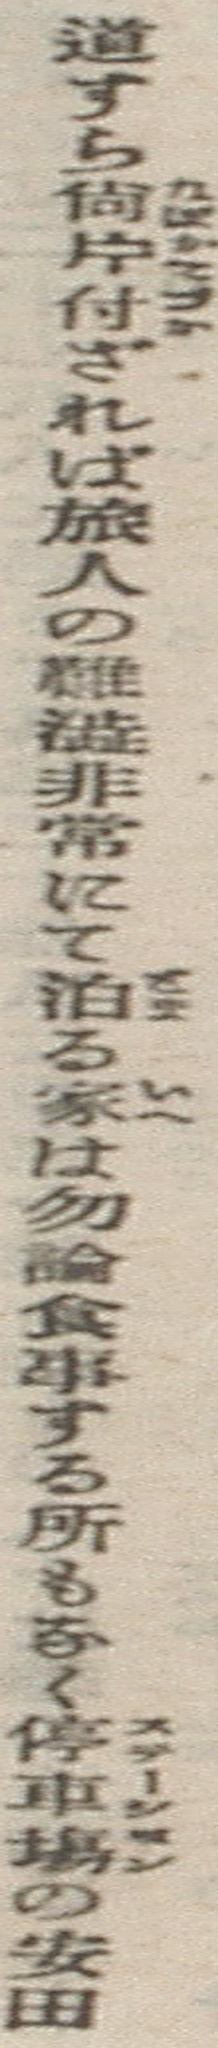道すら尚片付ざれば旅人の難渋非常にて泊る家は勿論食事する所もなく停車場の安田
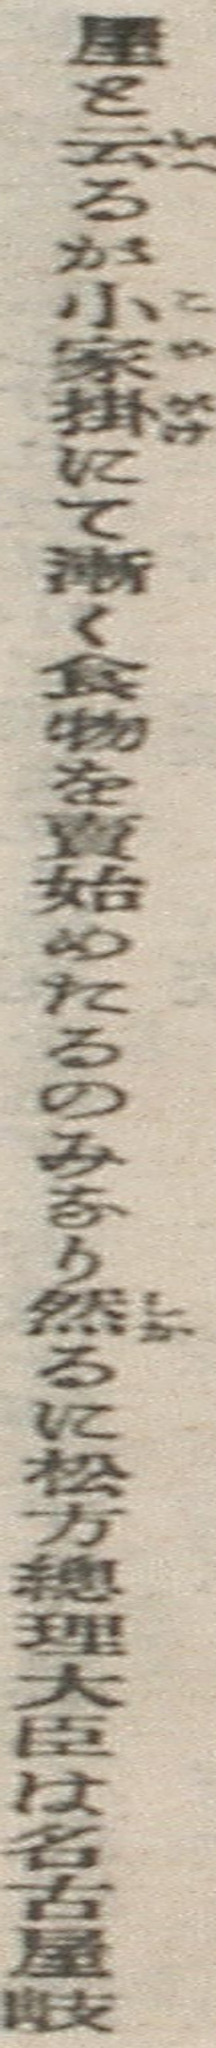屋と云るが小家掛にて漸く食物を売始めたるのみなり然るに松方総理大臣は名古屋岐
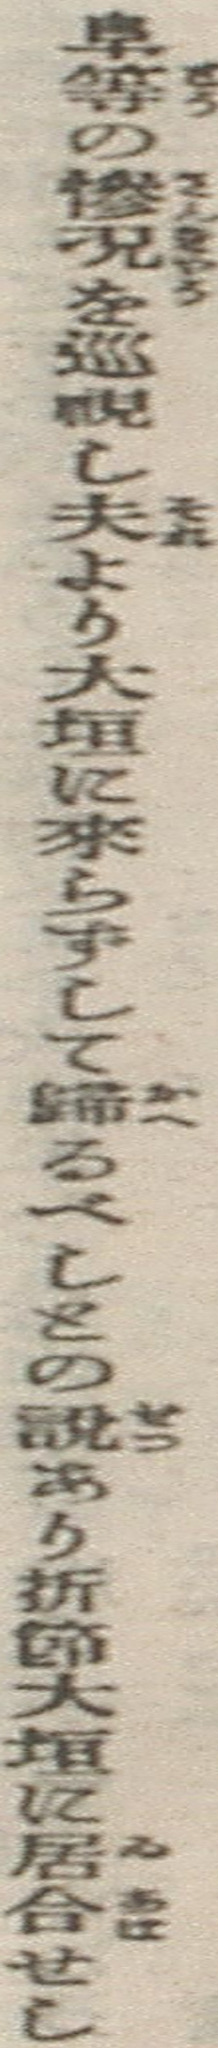阜等の惨况を巡視し夫より大垣に来らずして帰るべしとの説あり折節大垣に居合せし
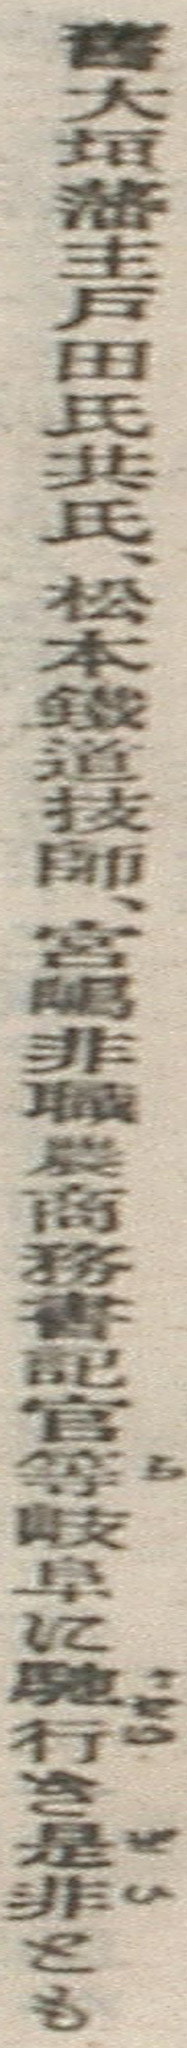旧大垣藩主戸田氏共氏、松本鉄道技師、宮嶋非職農商務書記官等岐阜に馳行き是非とも
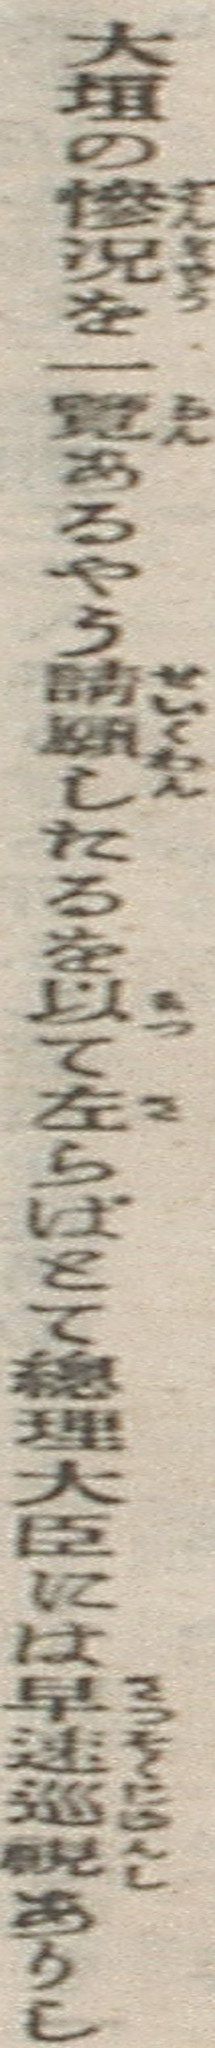大垣の惨况を一覧あるやう請願したるを以て左らばとて総理大臣には早速巡視ありし
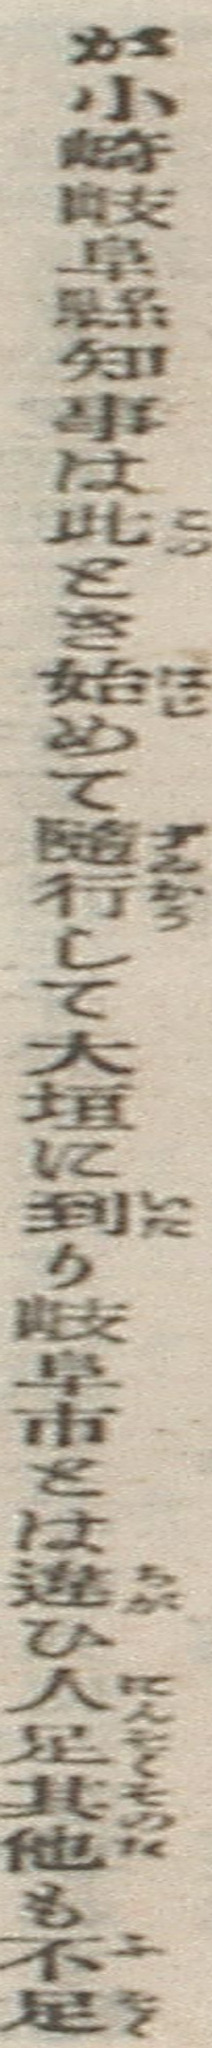が小崎岐阜県知事は此とき始めて随行して大垣に到り岐阜市とは違ひ人足其他も不足
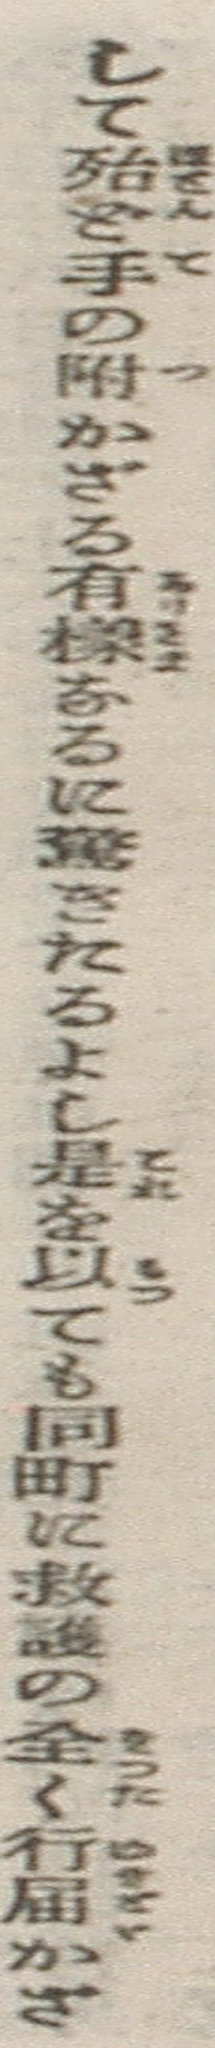して殆ど手の附かざる有様なるに驚きたるよし是を以ても同町に救護の全く行届かざ
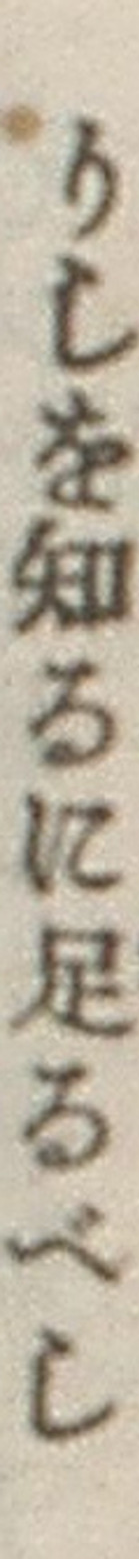りしを知るに足るべし
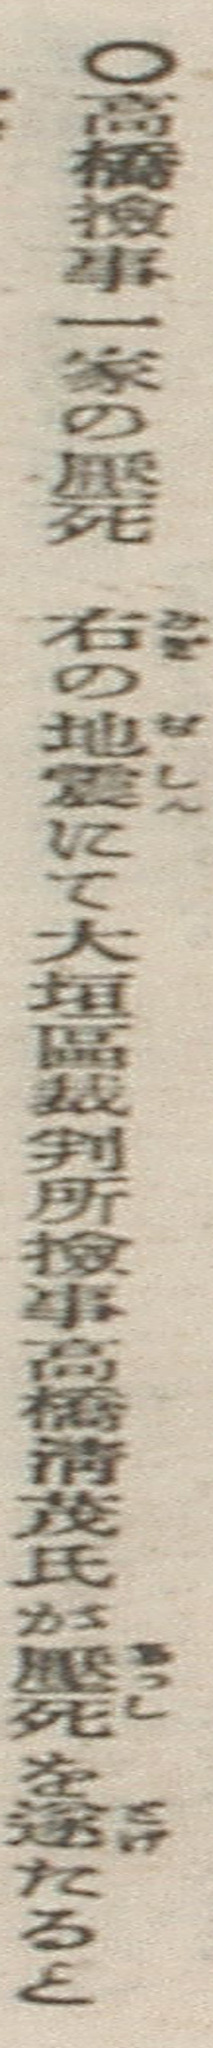○高橋検事一家の圧死右の地震にて大垣区裁判所検事高橋清茂氏が圧死を遂たること
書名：愛知岐阜福井三県　大地震見聞録（内題）
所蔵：東京大学地震研究所図書室 Earthquake Research Institute Library, The University of Tokyo, JAPAN
